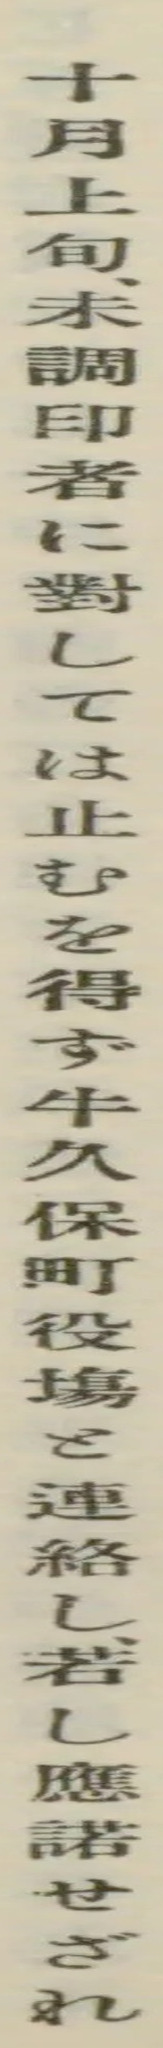十月上旬、未調印者に対してはｙやむを得ず牛久保町役場と連絡し、若し応諾せざれ
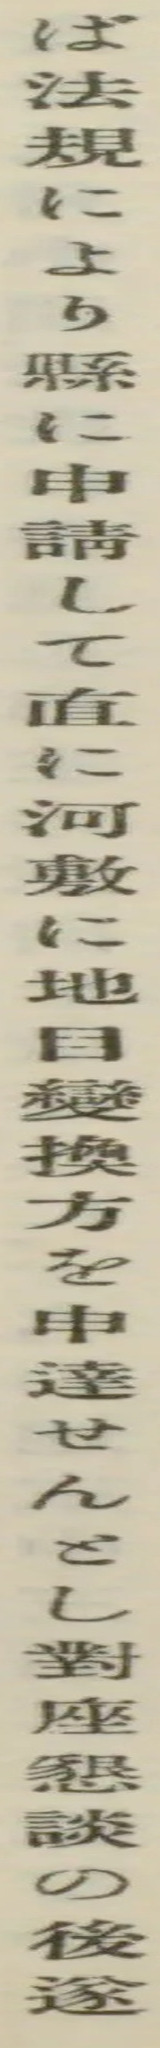ば法規により県に申請して直に河敷に耳目変換方を申達せんとし対座懇談の後遂
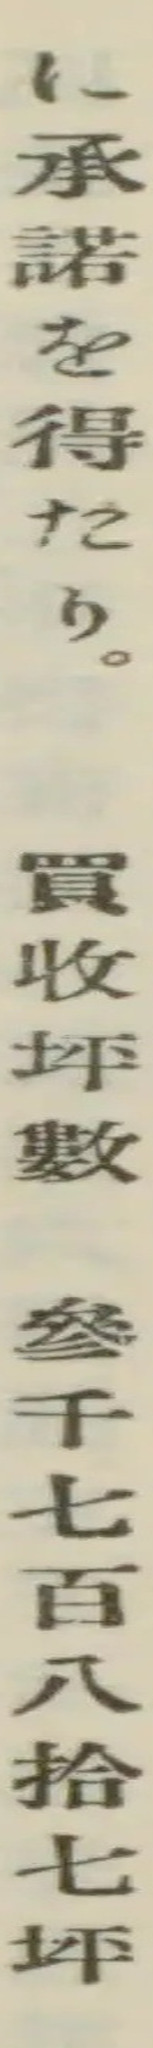に承諾を得たり。買収坪数參千七百八拾七坪
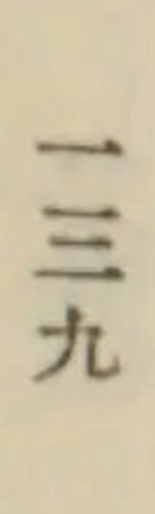一三九

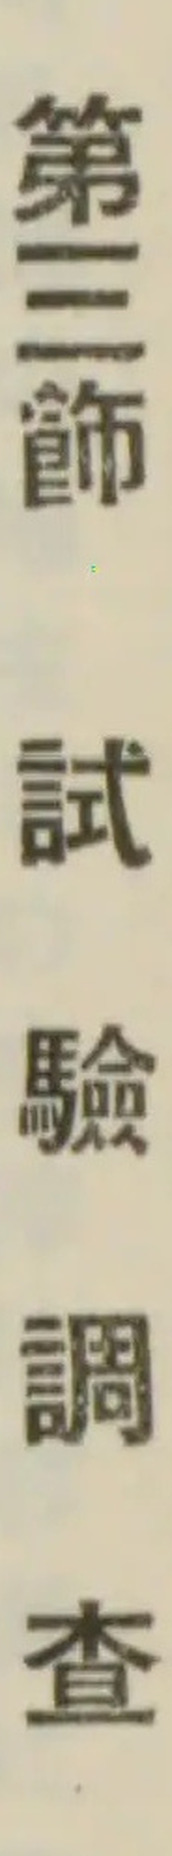第三節試験調査
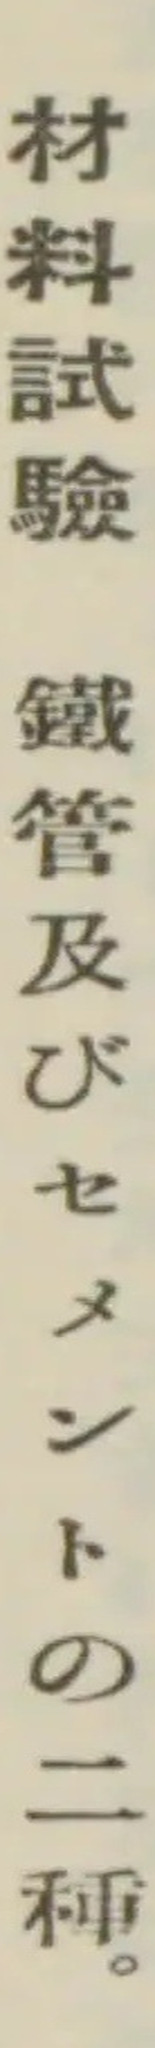材料試験鐵管及びセメントの二種。
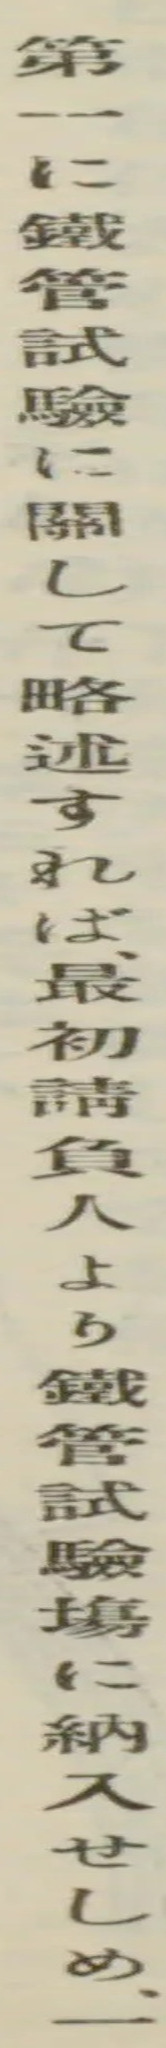第一に鐵管試験に関して略述すれば、最初請負人より鐵管試験場に納入せしめ、一
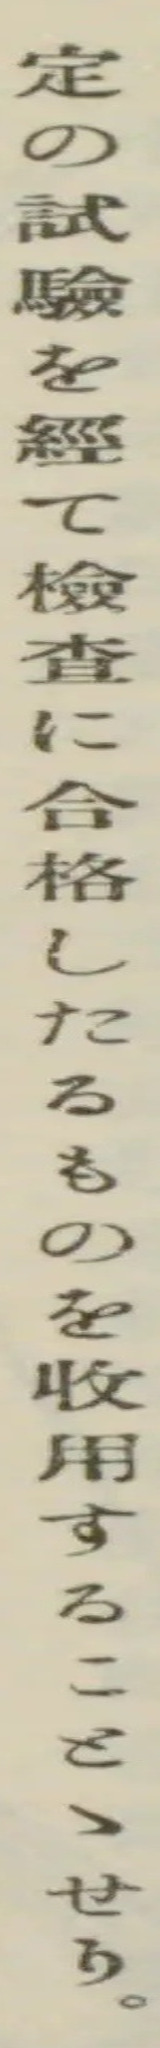定の試験を経て検査に合格したるものを収用することゝせり。
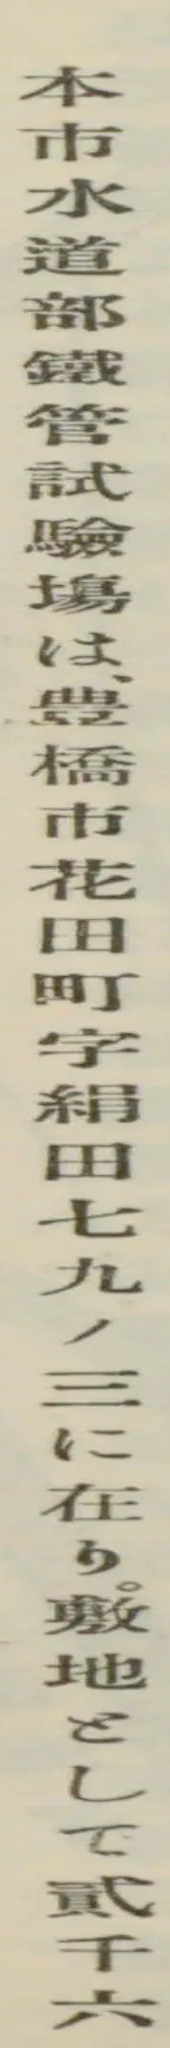本市水道部鐵管試験場は、と豊橋市花田町字絹田七九ノ三に在り。敷地として貳千六
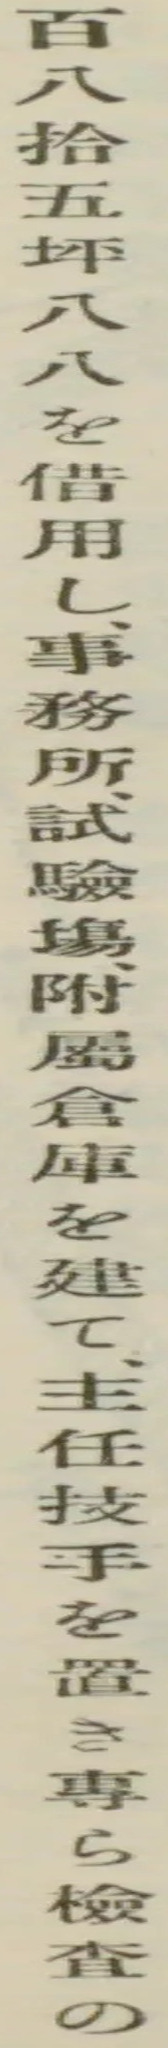百八拾五坪八八を借用し、事務所、試験場、付属倉庫を建て、主任技手を置き専ら検査の
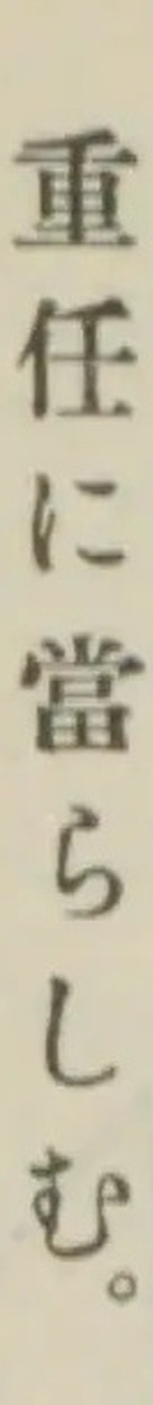重任に当らしむ。
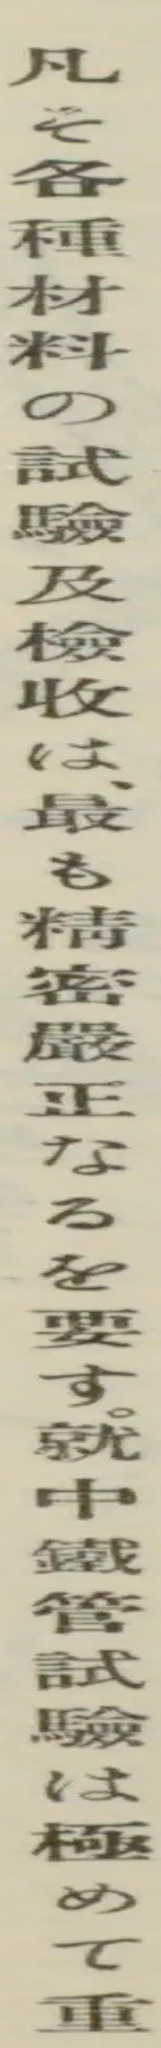凡そ各種材料の試験及検収は、最も精密厳正なるを要す。就中鐵管試験は極めて重
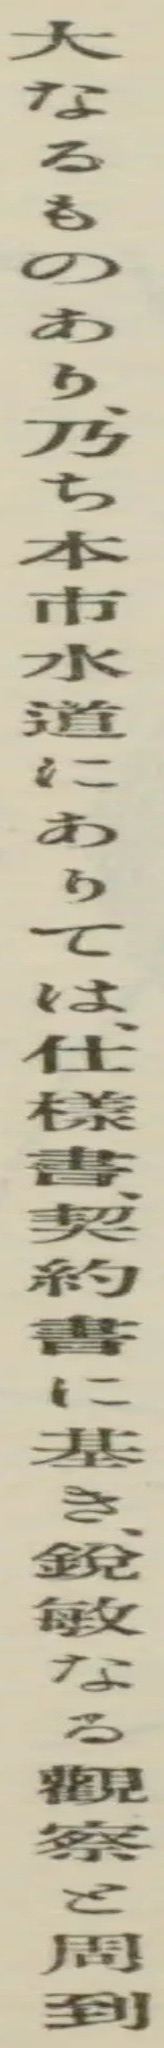大なるものあり、乃ち本市水道にありては、仕様書、契約書に基き、鋭敏なる観察と周到
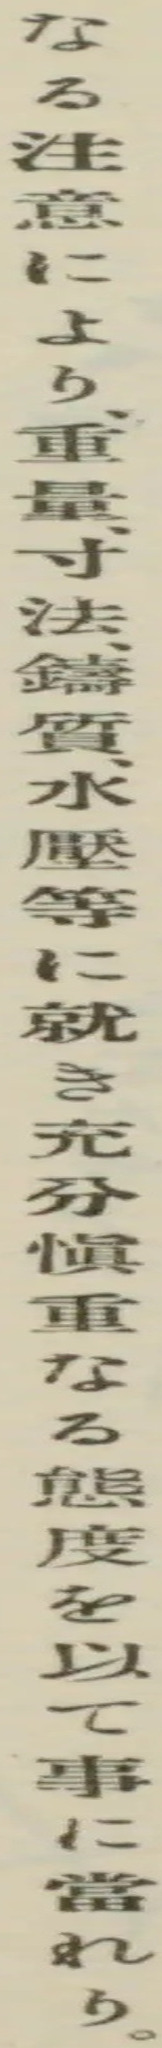なる注意により、重量、寸法、鋳質、水壓等に就き充分慎重なる態度を以て事に当れり。
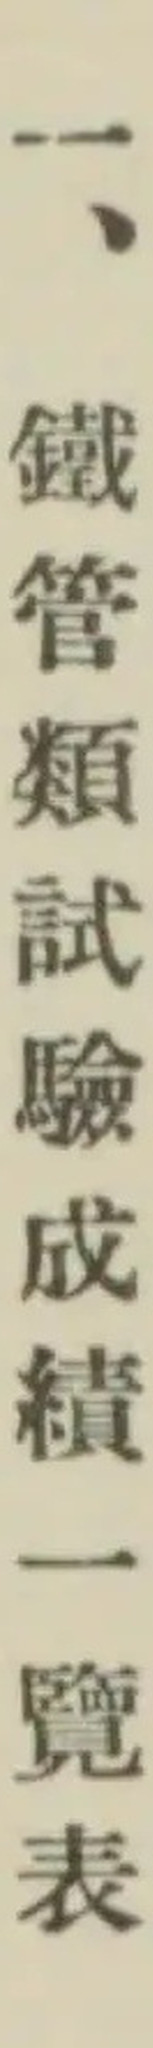一、鐵管類試験成績一覧表
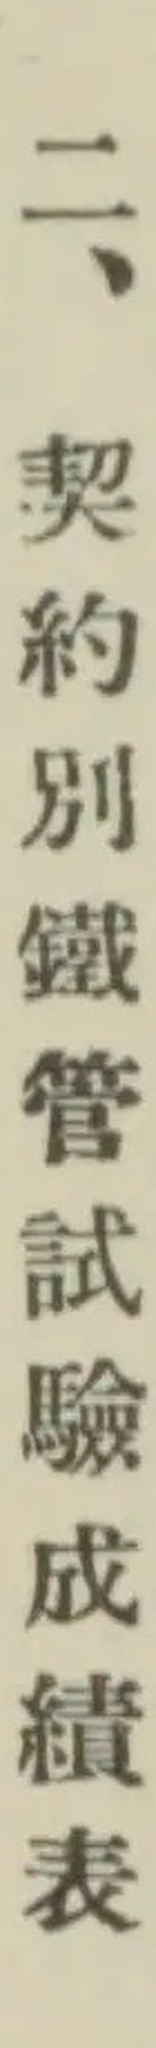二、契約別鐵管試験成績表
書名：豊橋市水道誌
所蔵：国立国会図書館 National Diet Library, JAPAN
